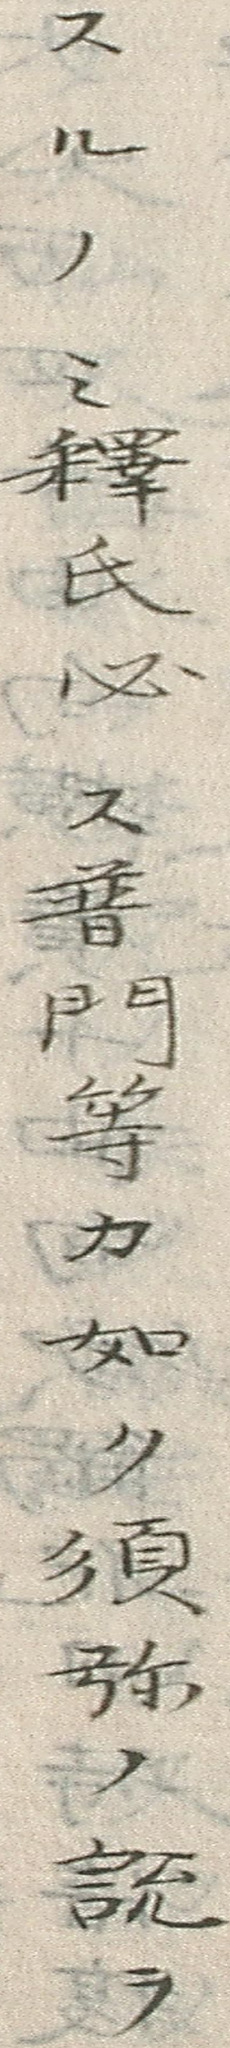スルノミ釈氏必ス普門等カ如ク須弥ノ説ヲ
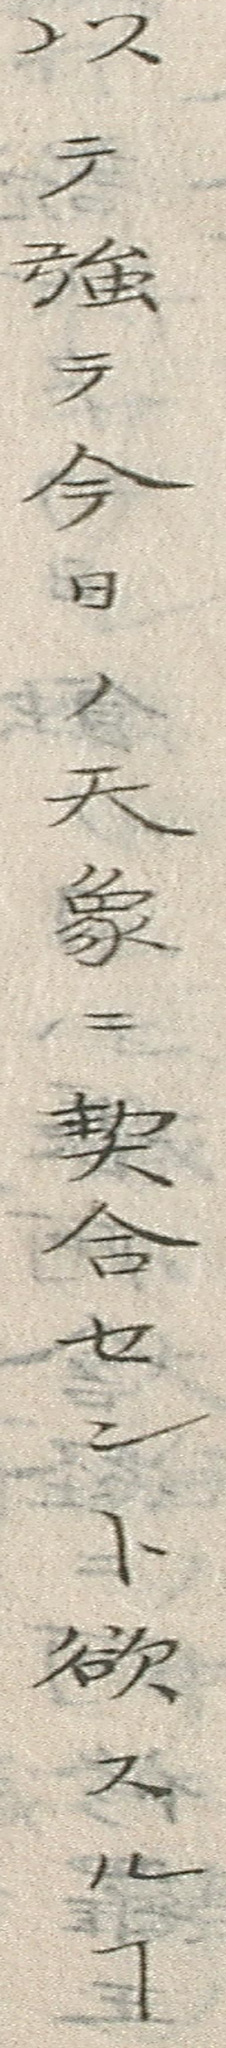以テ強テ今日ノ天象ニ契合セント欲スルコト
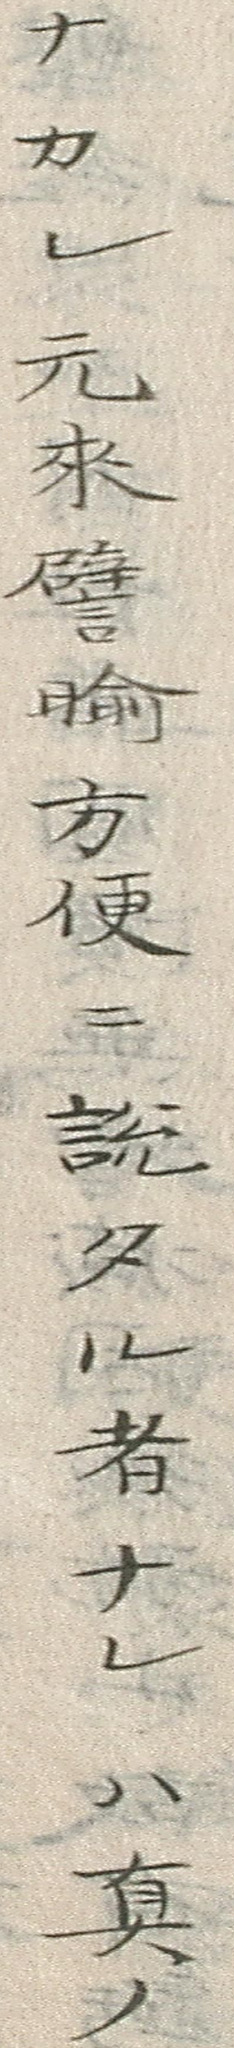ナカレ元来譬喩方便ニ説タル者ナレハ真ノ
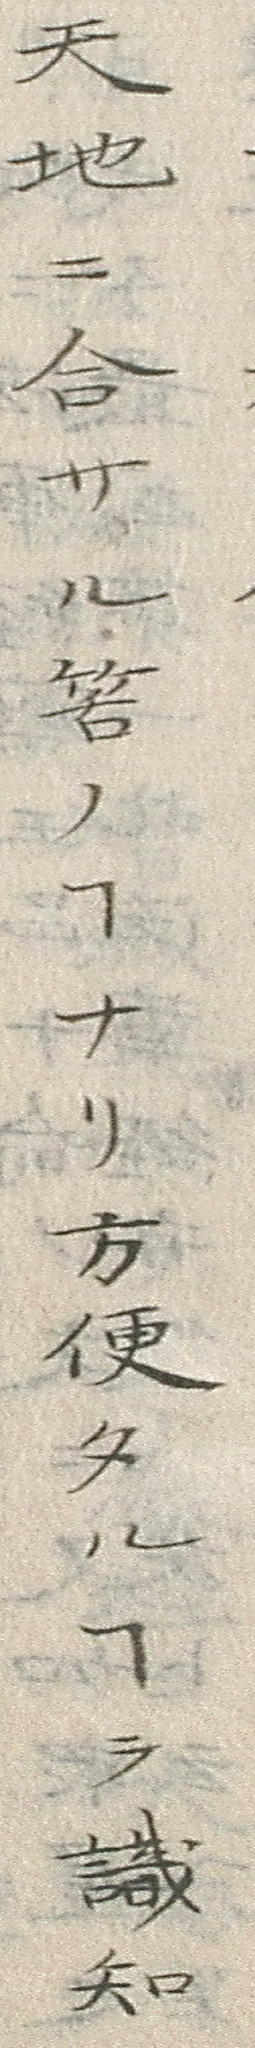天地ニ合サル筈ノコトナリ方便タルコトヲ識知
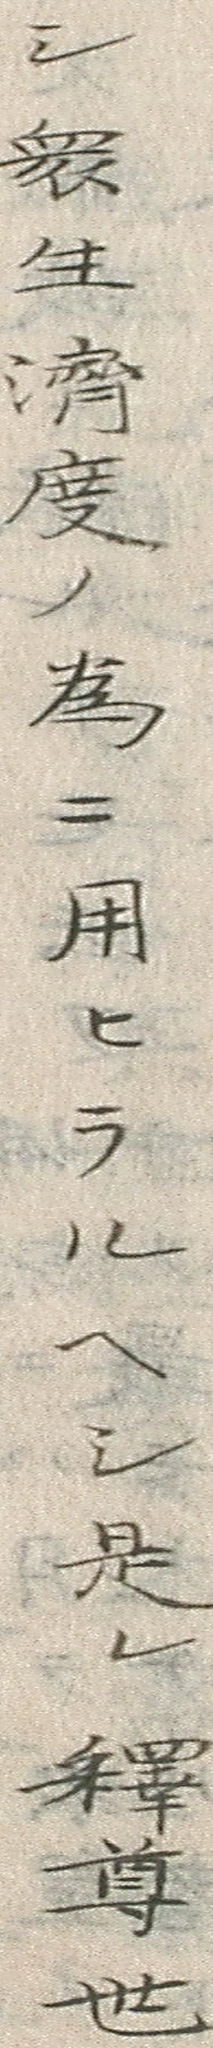シ衆生済度ノ為ニ用ヒラルヘシ是レ釈尊世
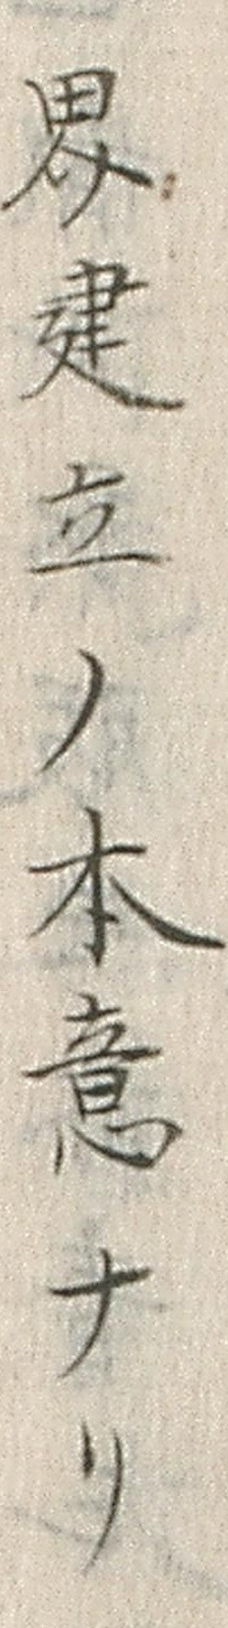界建立ノ本意ナリ
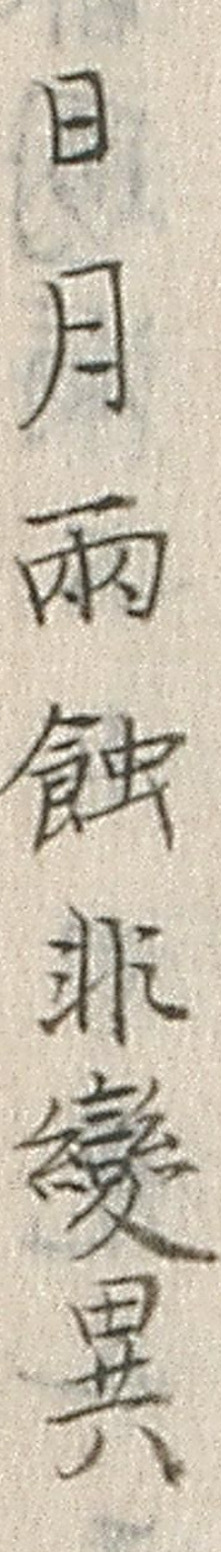日月両蝕非変異
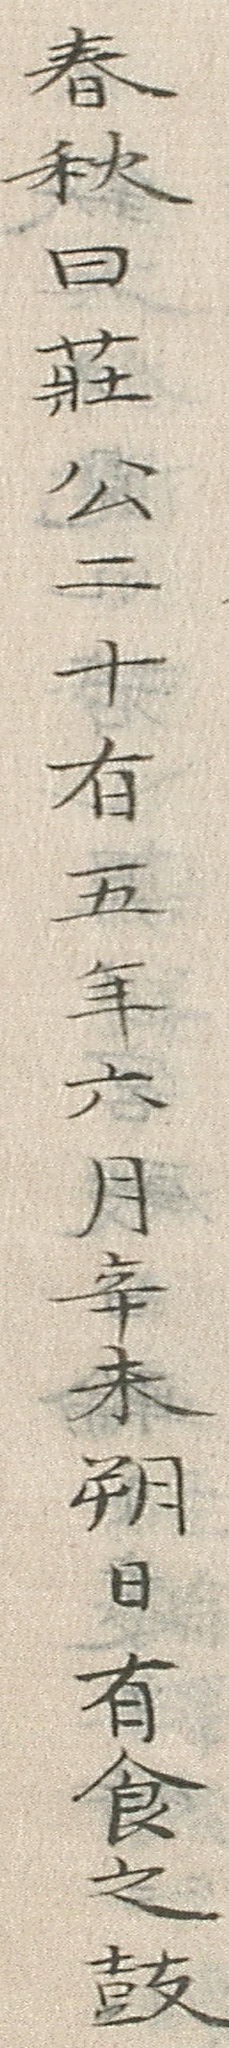春秋曰荘公二十有五年六月辛未朔日有食之鼓
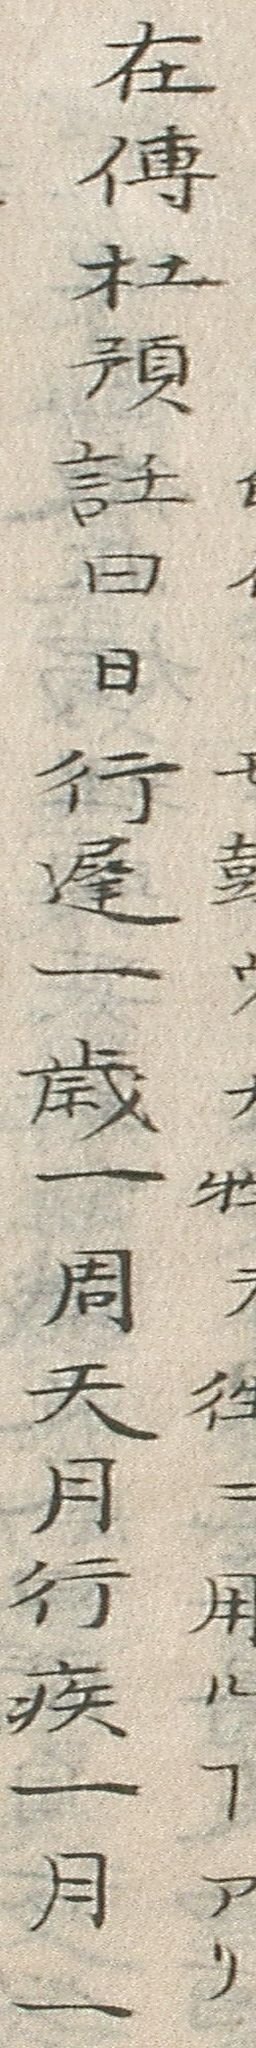左伝杜預註曰日行遅一歳一周天月行疾一月一
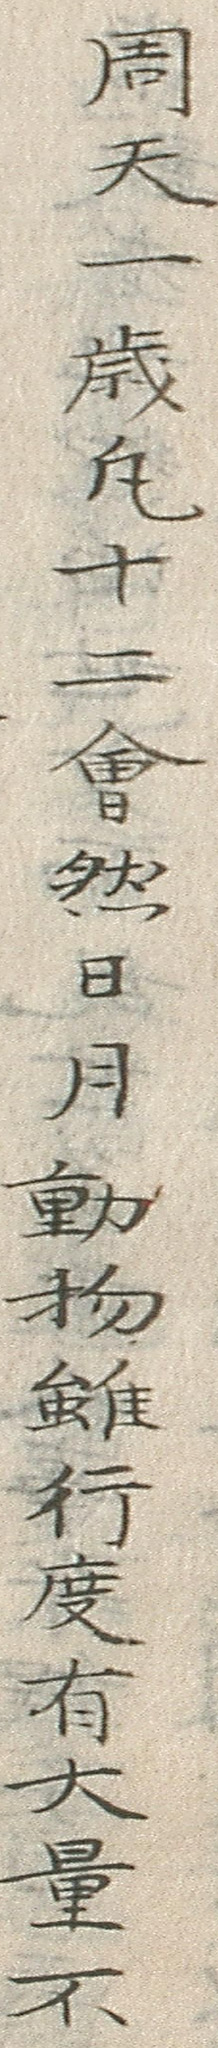周天一歳凡十二会然日月動物雖行度有大量不
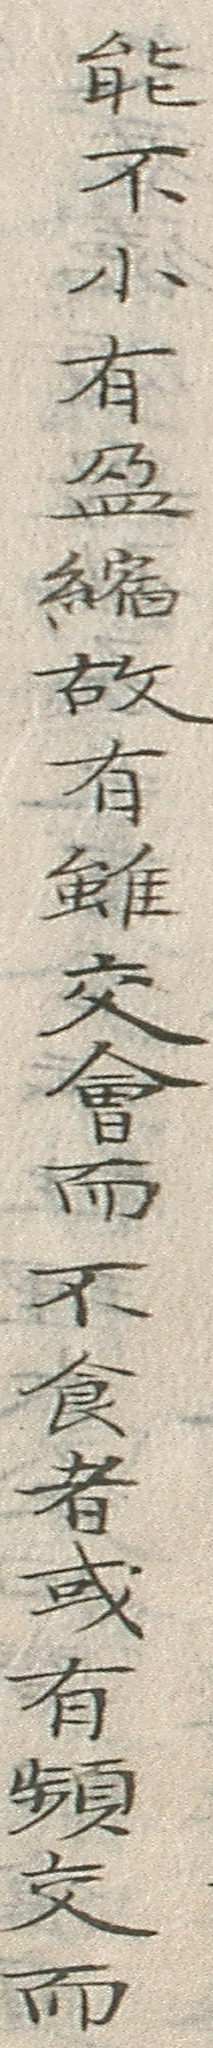能不小有盈編故有雖交会而不食者或有頻交而
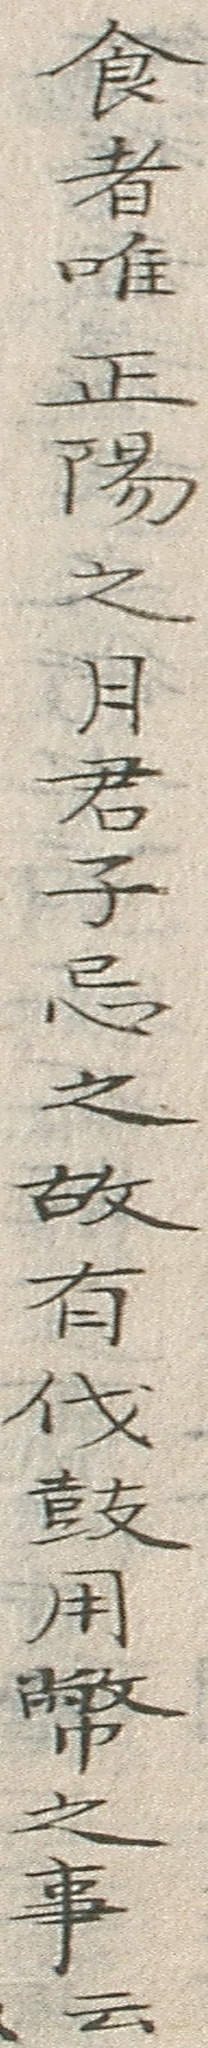食者唯正陽之月君子忌之故有伐鼓用幣之事云〻
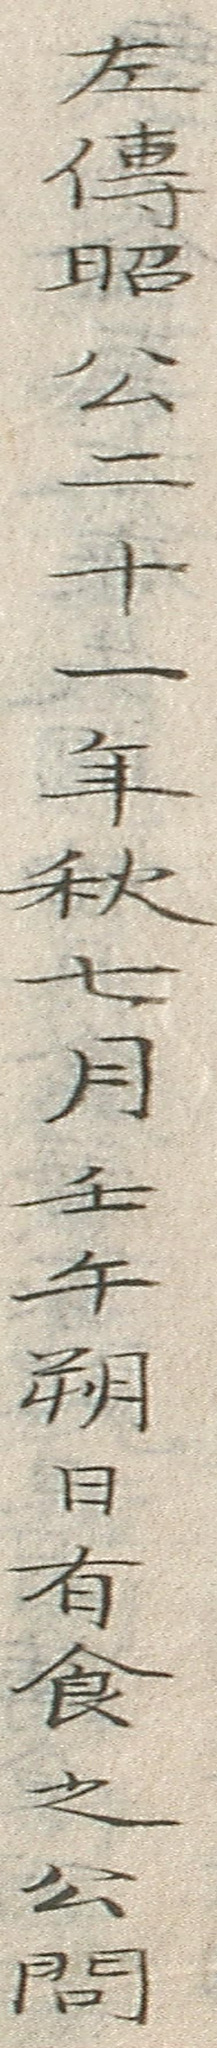左伝昭公二十一年秋七月壬午朔日有食之公問
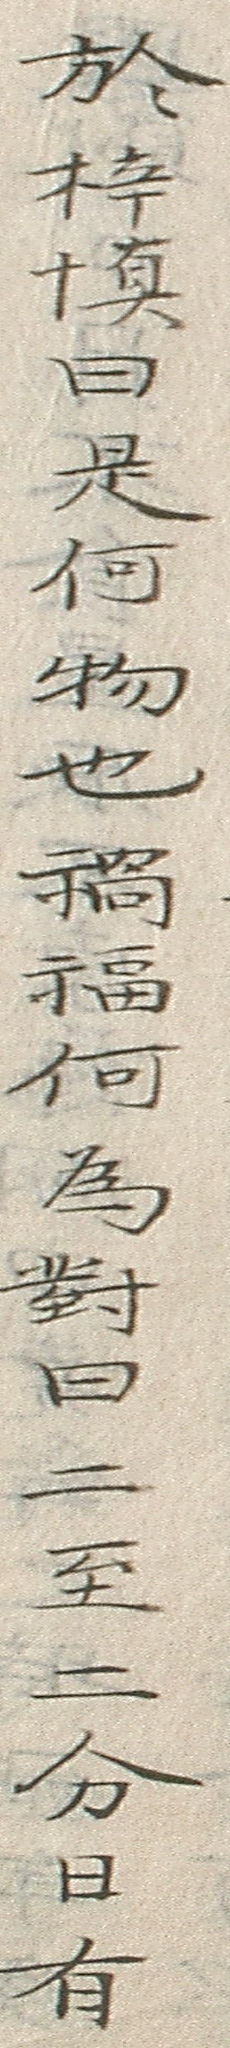於梓慎曰是何物也禍福何為対曰二至二分日有
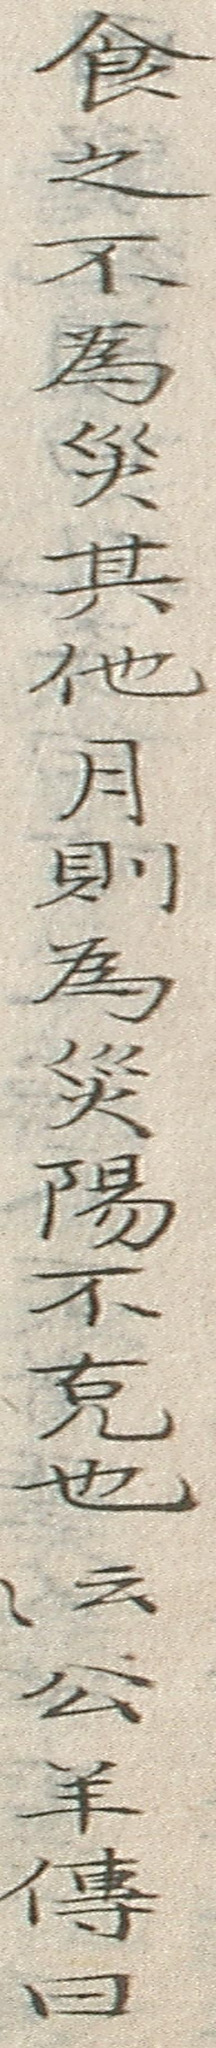食之不為災其他月則為災陽不克也云〻公羊伝曰
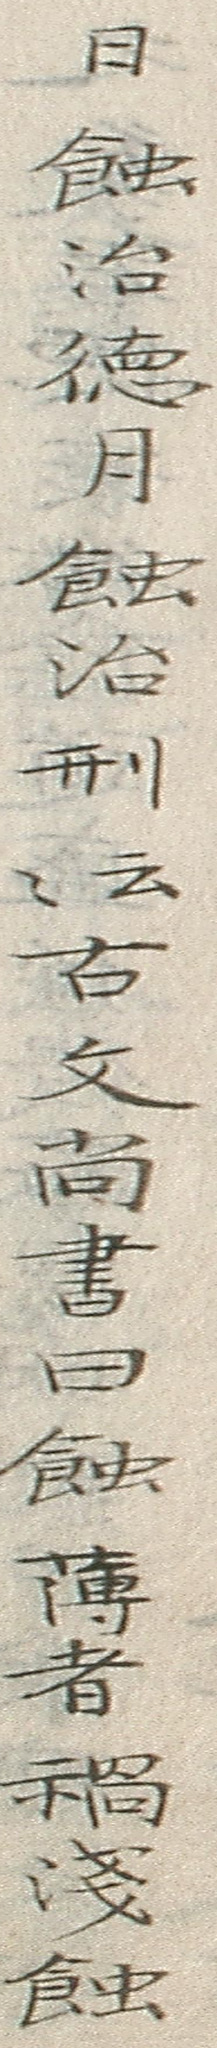日蝕治徳月蝕治刑云〻古文尚書曰蝕薄者禍浅蝕
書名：天學略名目羽翼　全
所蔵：東京大学地震研究所図書室 Earthquake Research Institute Library, The University of Tokyo, JAPAN
